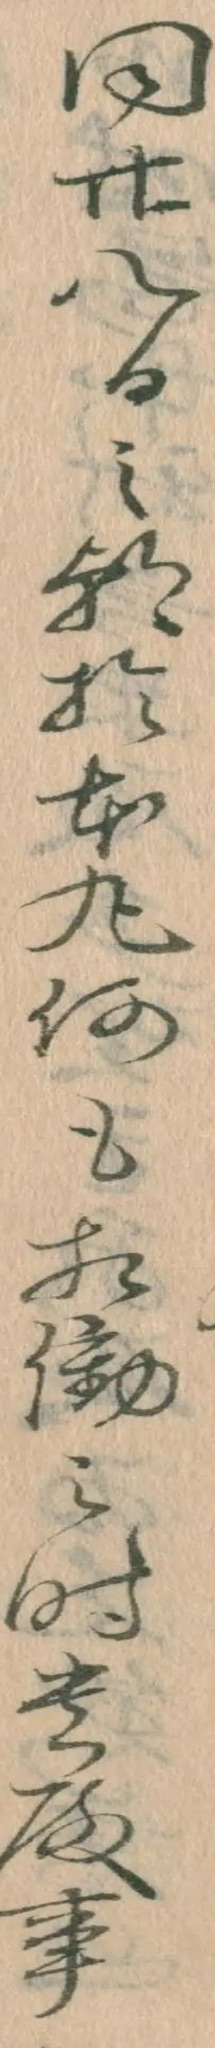一同廿八日之朝於本丸何も相働之時貴殿事
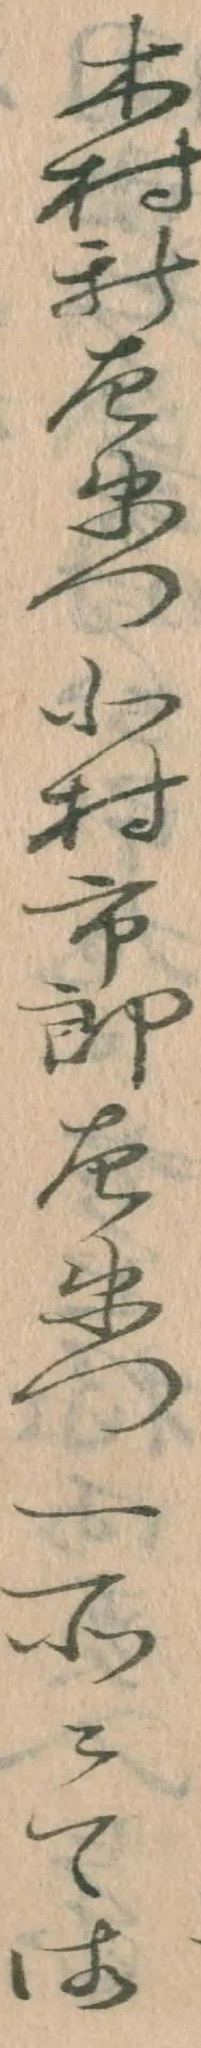木村新左衛門北村市郎左衛門一所にて御
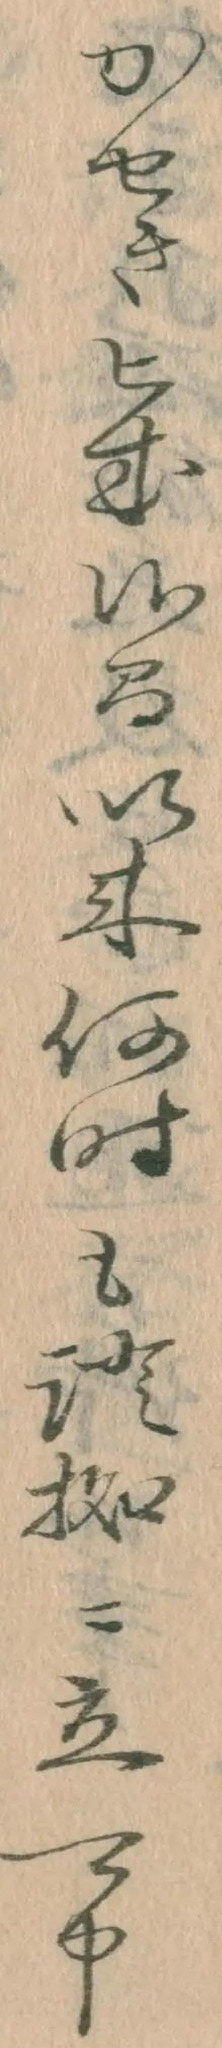加せき被成候間以来何時も證拠に立可申
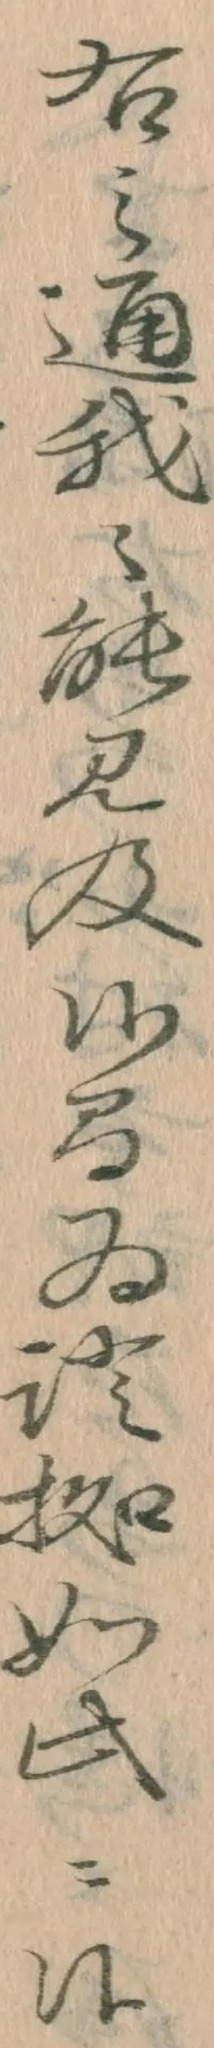右之通我々能見及候間ゐ證拠如此に候
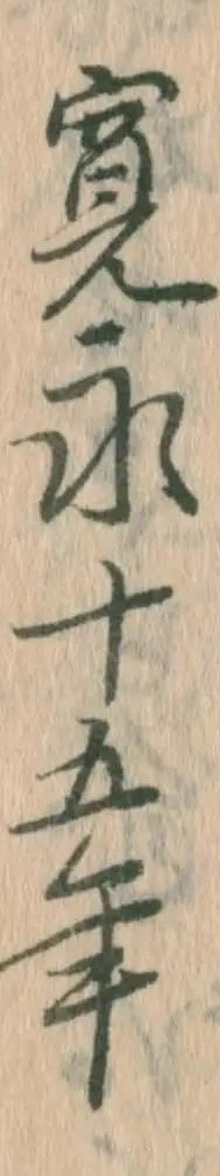寛永十五年
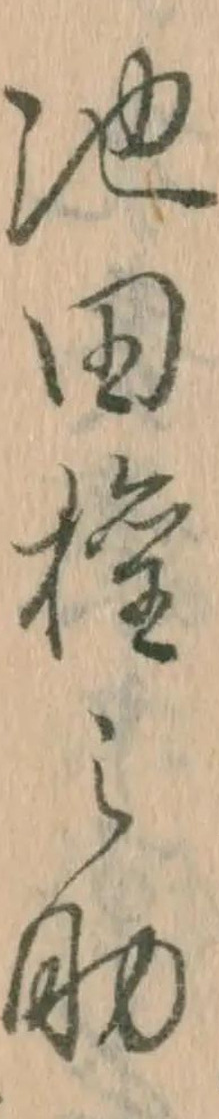池田権之助
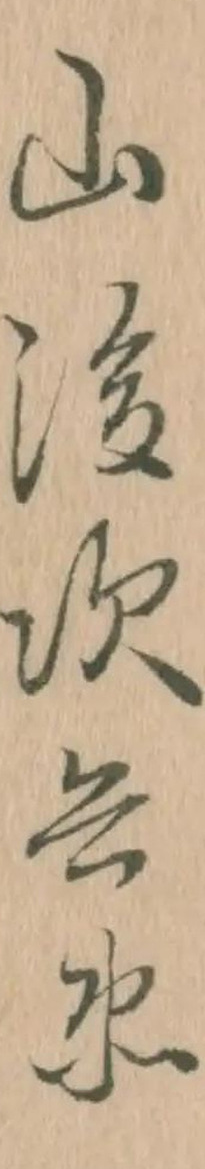山後次兵衛
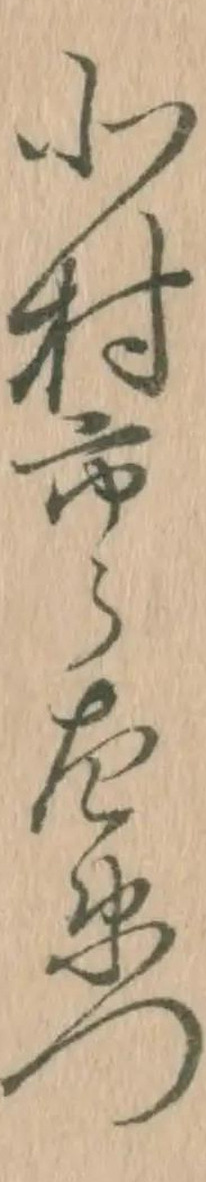北村市郎左衛門
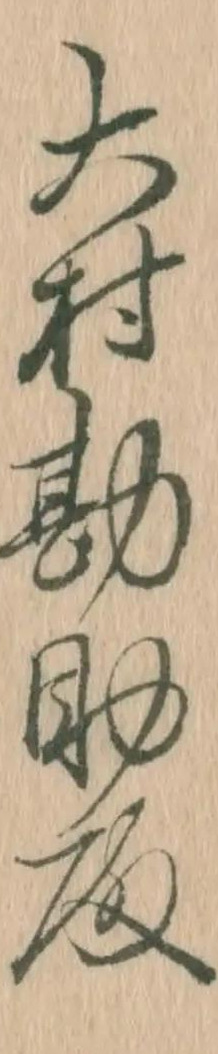大村勘助殿
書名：切支丹御退治記 49巻. [9]
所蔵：国立国会図書館 National Diet Library, JAPAN
